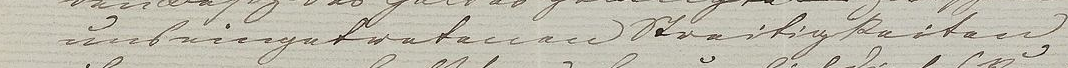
uns eingetretenen Streitigkeiten
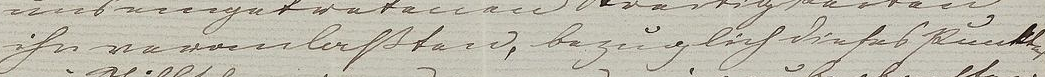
ihn veranlaßten, bezüglich dieses Punktes
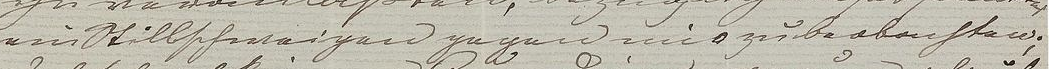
ein Stillschweigen gegen mir zu beobachten.
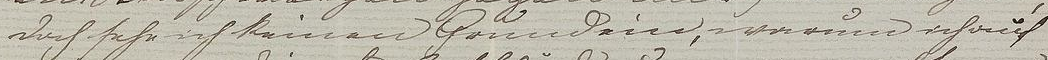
Doch sehe ich keinen Grund ein, warum ich auf
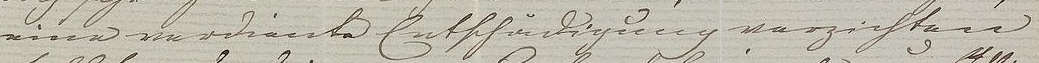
eine verdiente Entschädigung verzichten
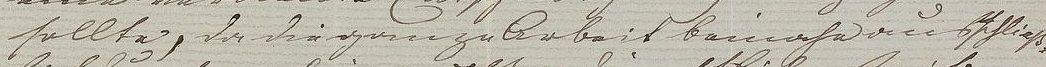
sollte, da die ganze Arbeit beinahe ausschließ-
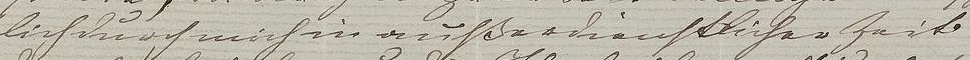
lich durch mich in außerdienstlicher Zeit
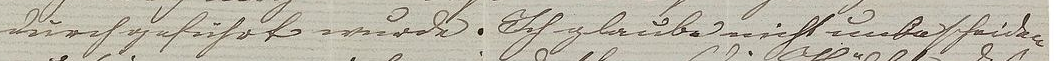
durchgeführt wurde. Ich glaube nicht unbescheiden
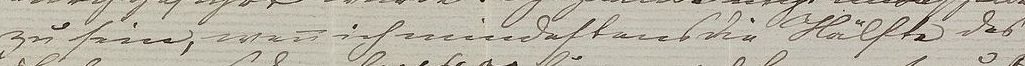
zu sein, wenn ich mindestens die Hälfte des
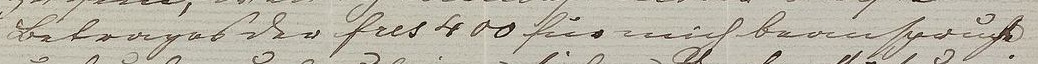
Betrages der frcs 400 für mich beanspruche
